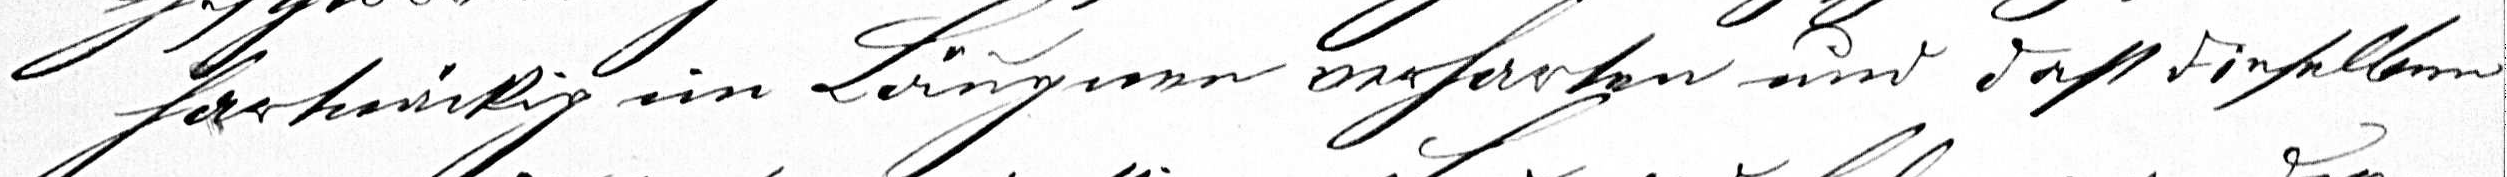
hartnäckig im Läugnen verharten und daß dieselben
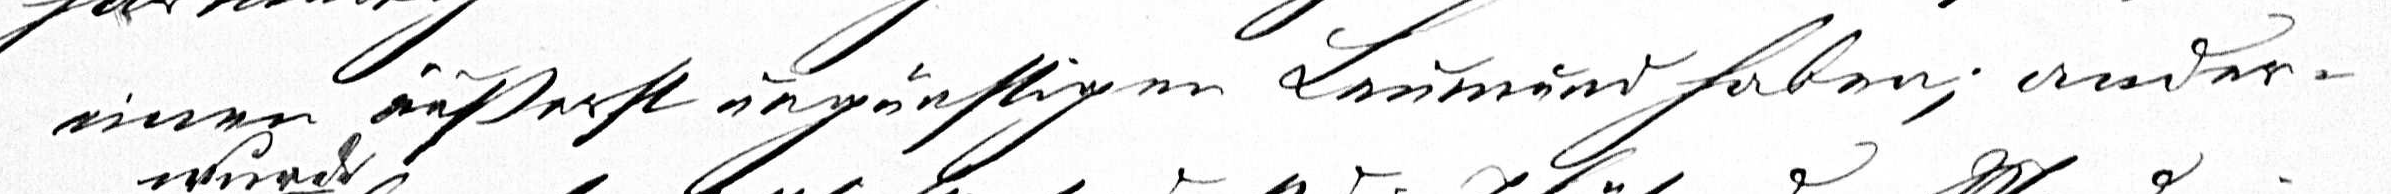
einen äußerst ungünstigen Leumund haben; ander¬
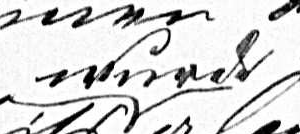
wurde
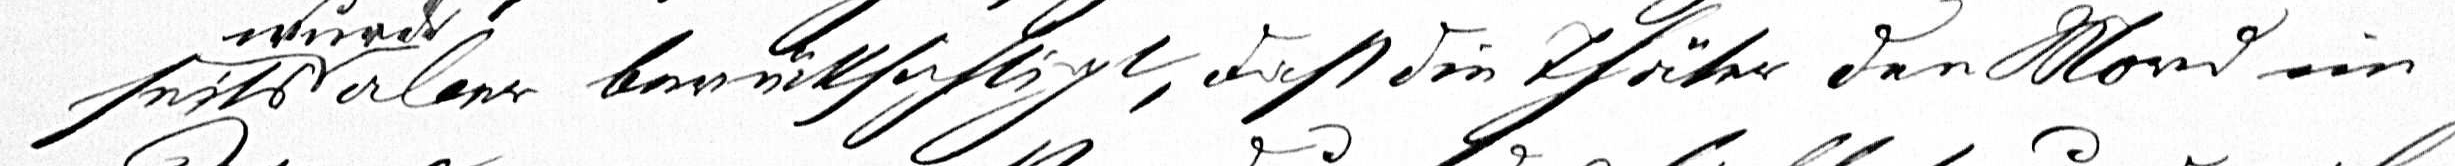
seits aber berücksichtigt, daß die Thäter den Mord im
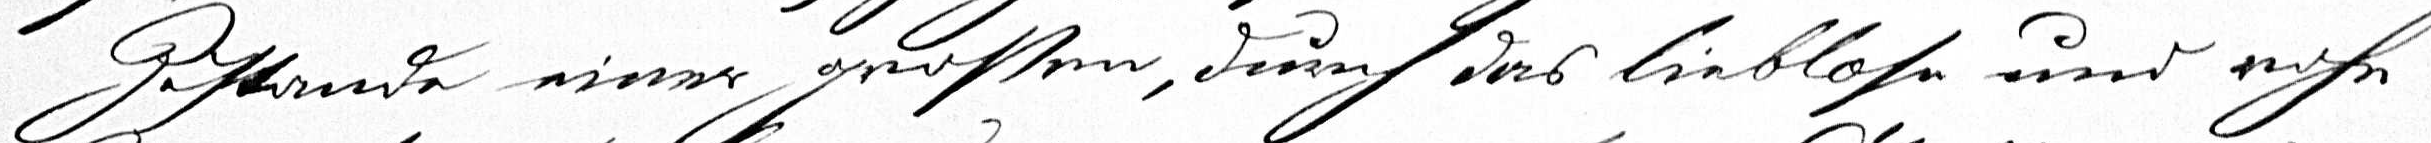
Zustande einer großen, durch das lieblose und rohe
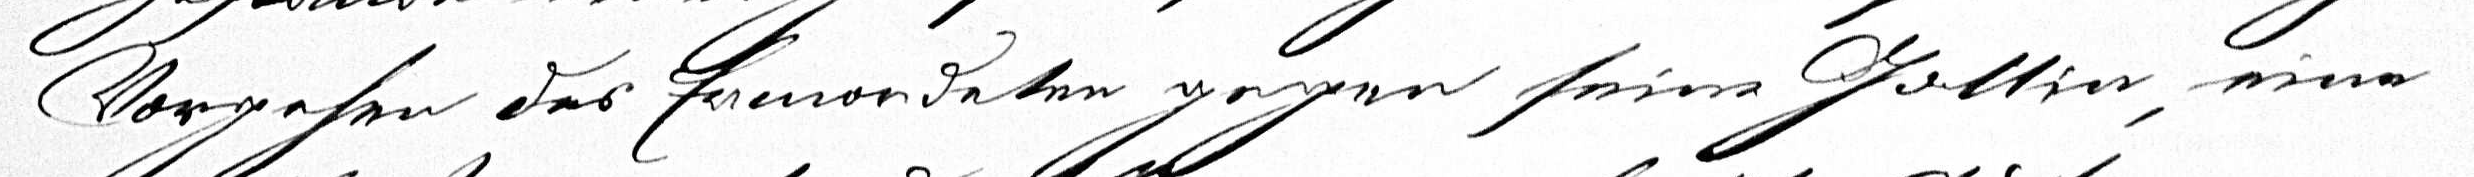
Vorgehen des Ermordeten gegen seine Gattin, eine
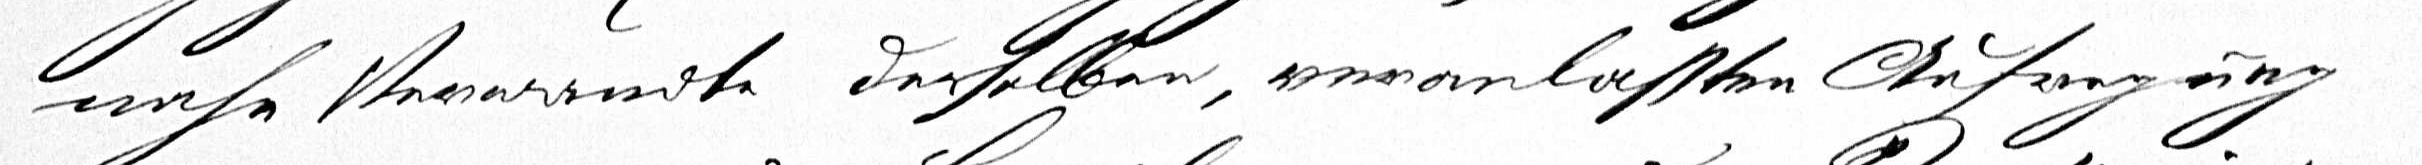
nahe Verwandte derselbe, veranlaßten Aufregung
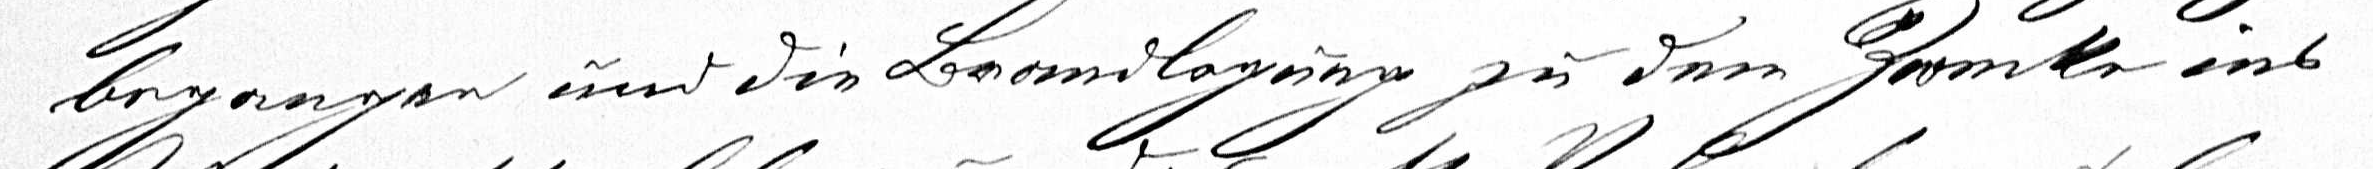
begangen und die Brandlegung zu dem Zwecke ins
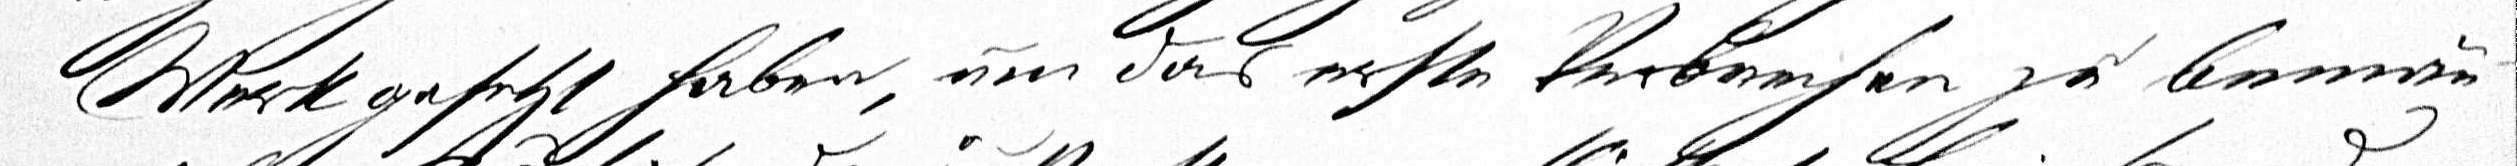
Werk gesetzt haben, um das erste Verbrechen zu bemän¬
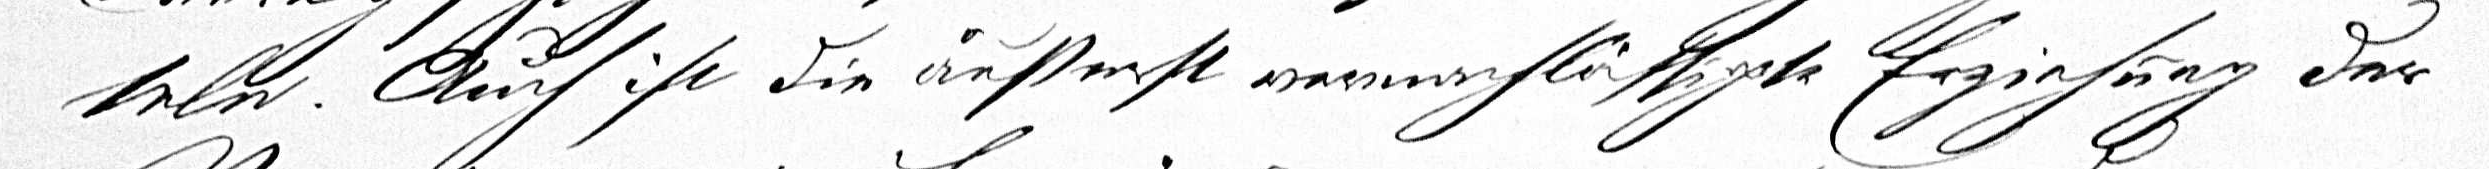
teln. Auch ist die äußerst vernachlässigte Erziehung der
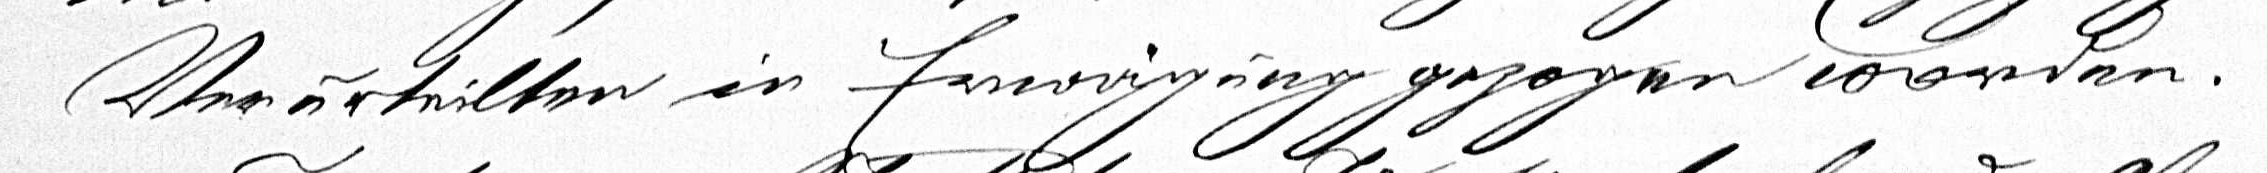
Verurteilten in Erwägung gezogen worden.
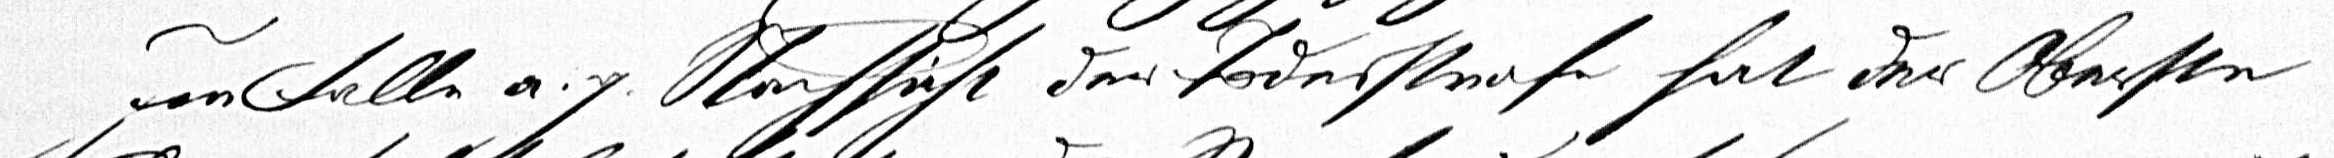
Jm Falle a. g. Nachsicht der Todesstrafe hat der Oberste
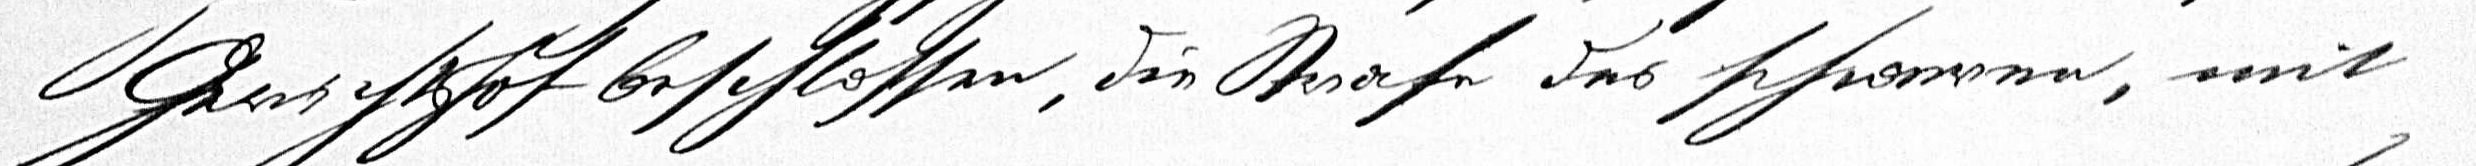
Gerichtshof beschlossen, die Strafe des schweren, mit
